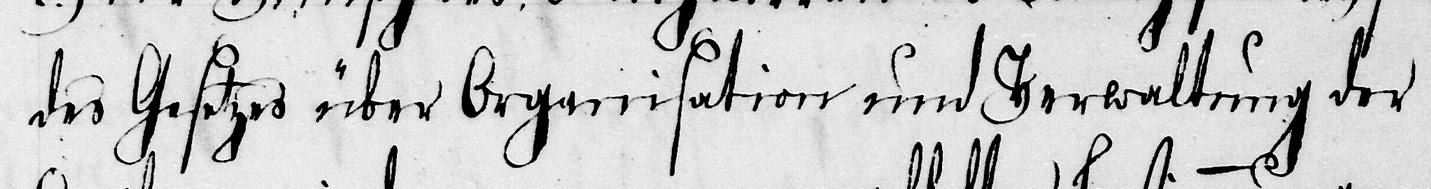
des Gesetzes über Organisation und Verwaltung der
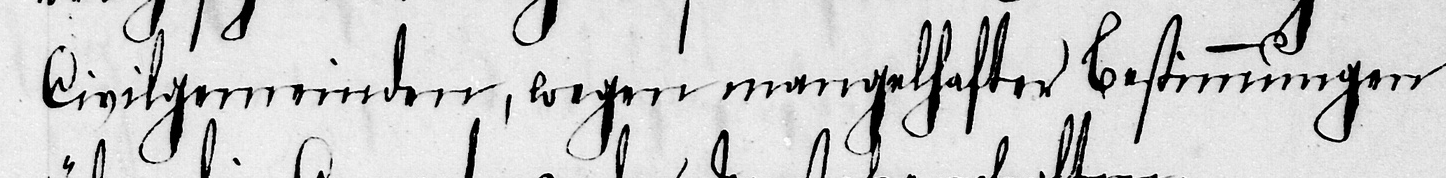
Civilgemeinden, wegen mangelhafter Bestimmungen
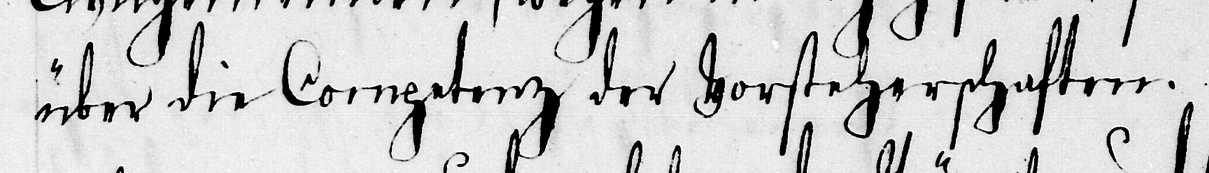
über die Competenz der Vorsteherschaften.
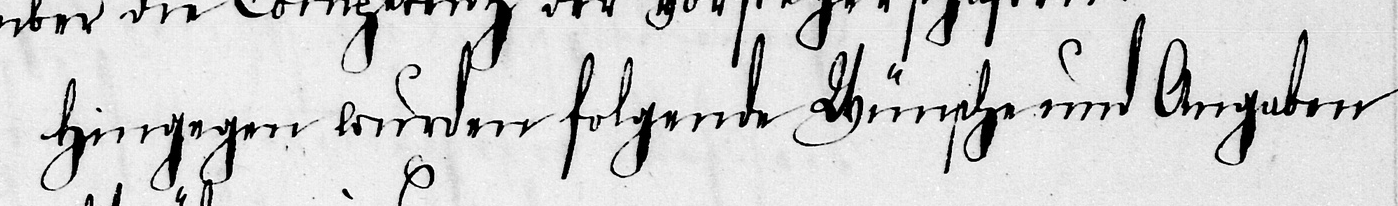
Hingegen wurden folgende Wünsche und Angaben
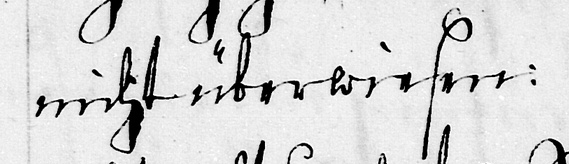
nicht überwiesen:
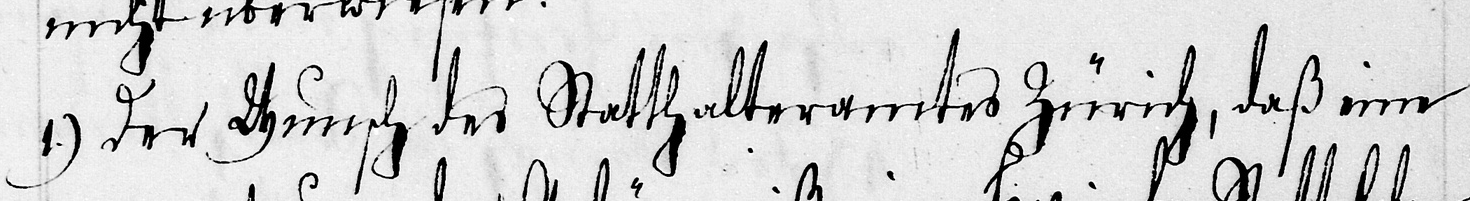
1.) Der Wunsch des Statthalteramtes Zürich, daß eine
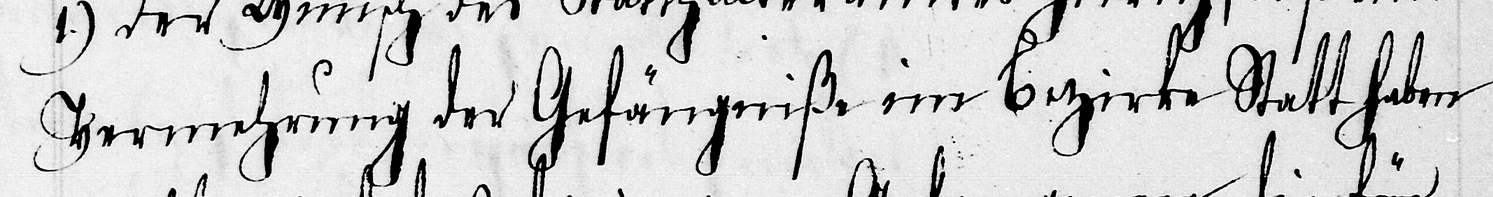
Vermehrung der Gefängniße im Bezirke Statt haben
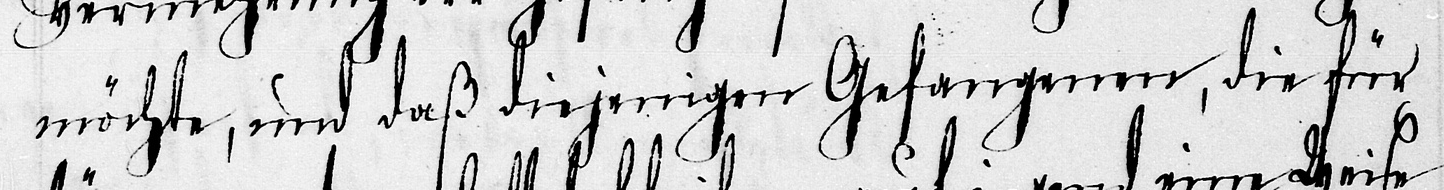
möchte, und daß diejenigen Gefangenen, die für
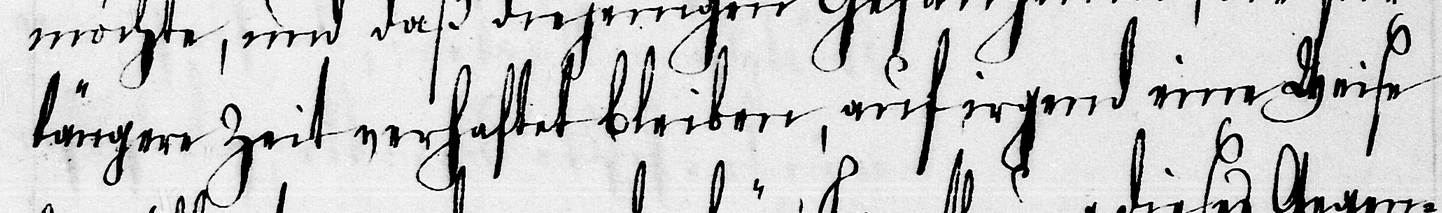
längere Zeit verhaftet bleiben, auf irgend eine Weise
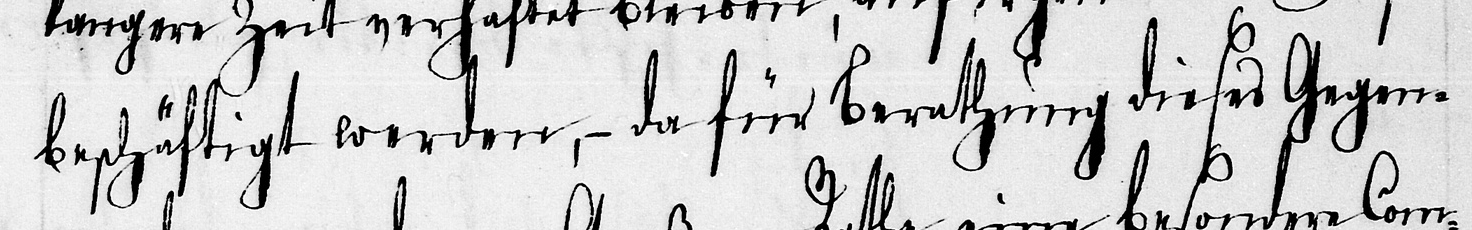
beschäftigt werden, – da für Berathung dieses Gegen¬
